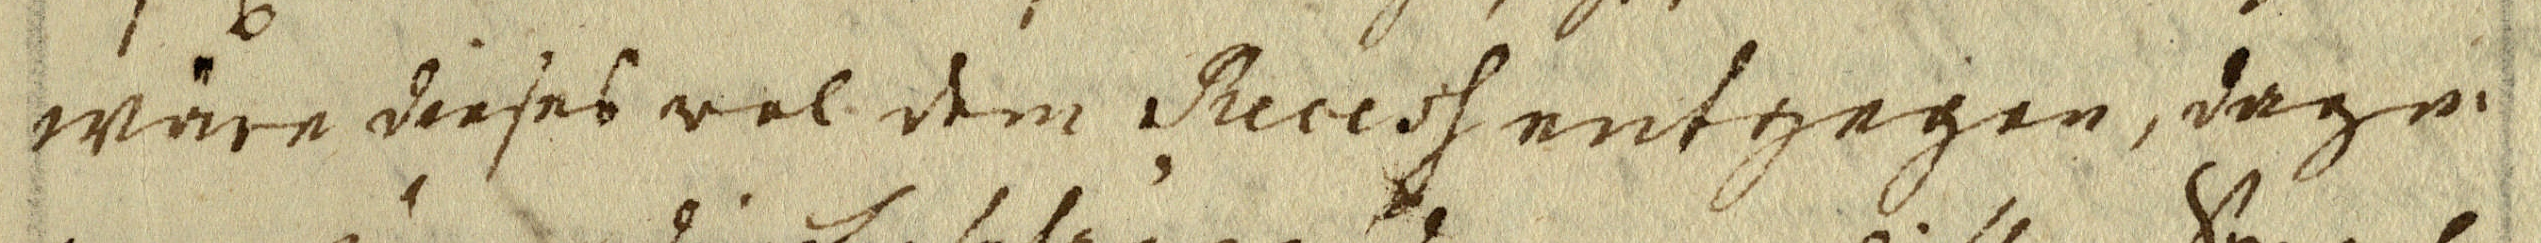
wäre dieses wol dem Recess entgegen, dage¬
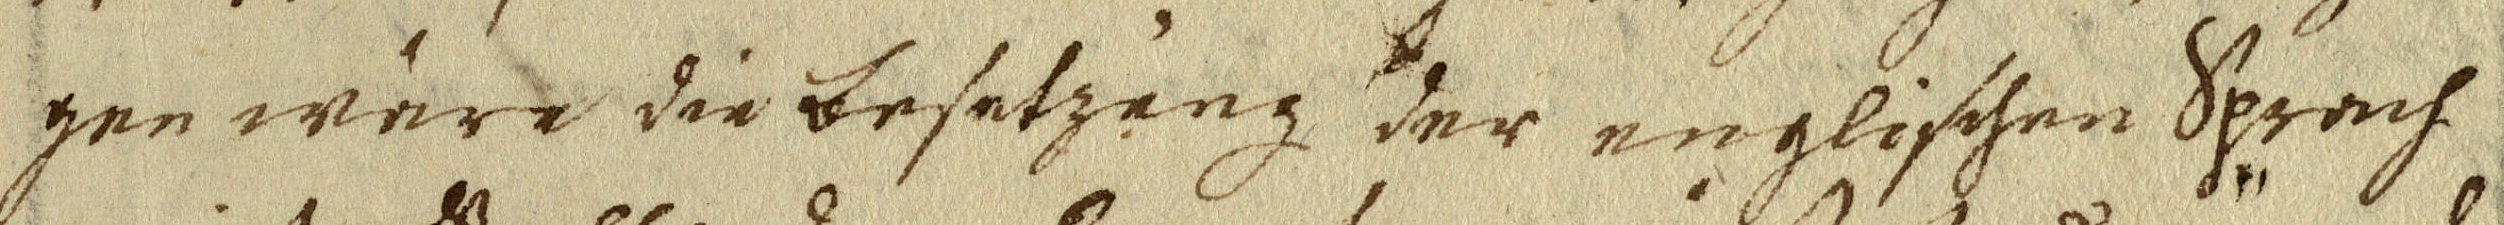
gen wäre die Besetzung der englischen Sprach
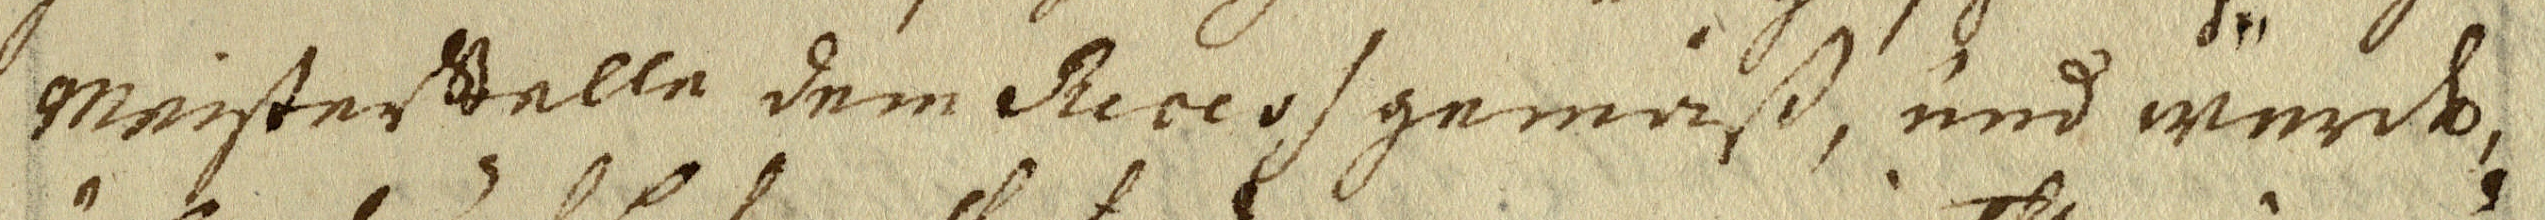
Meisterstelle dem Recess gemäß, und würde,
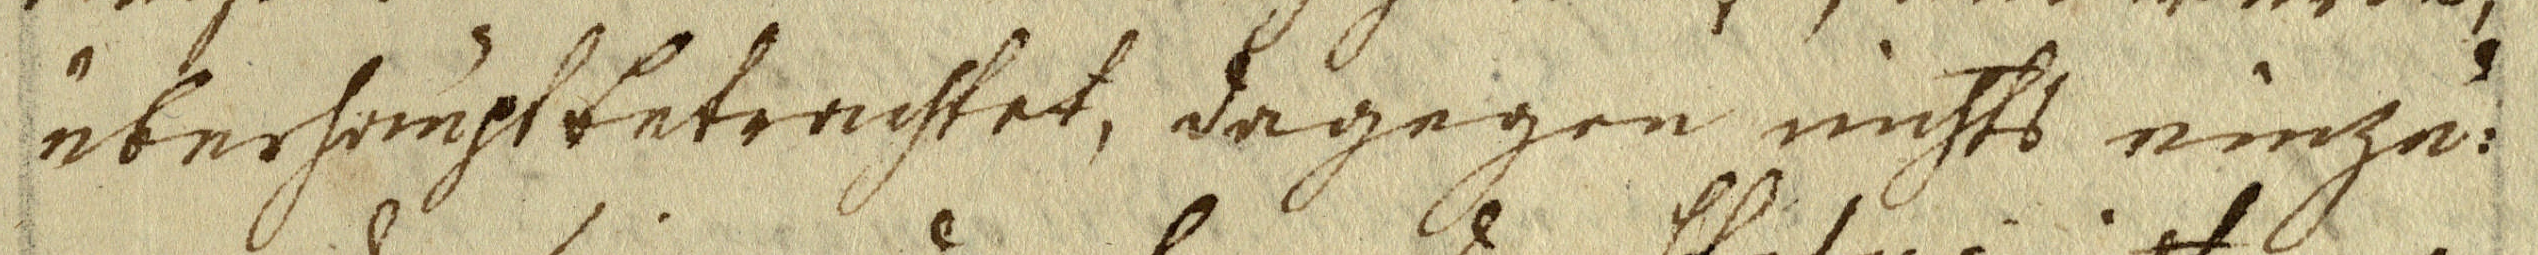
überhaupt betrachtet, dagegen nichts einzu¬
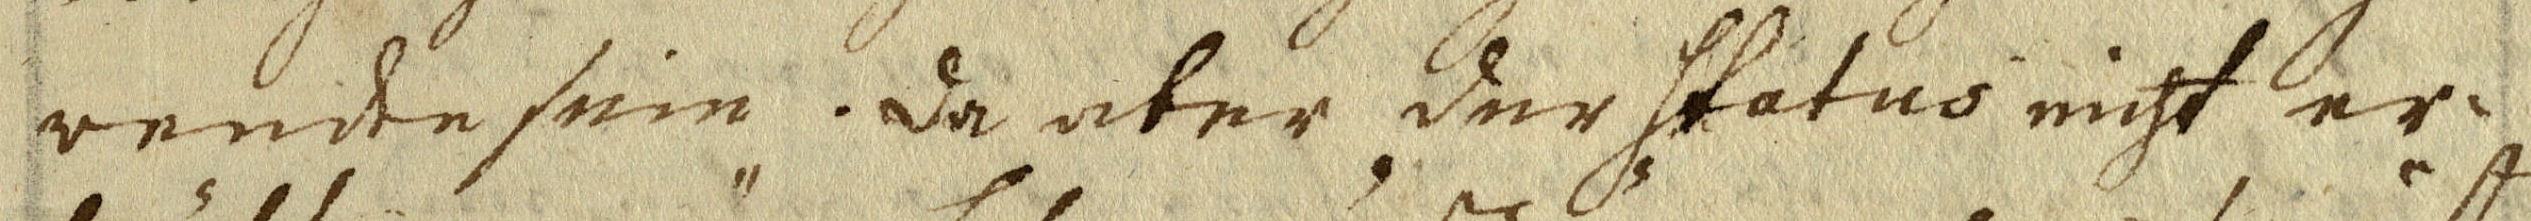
wenden sein. Da aber der Status nicht er¬
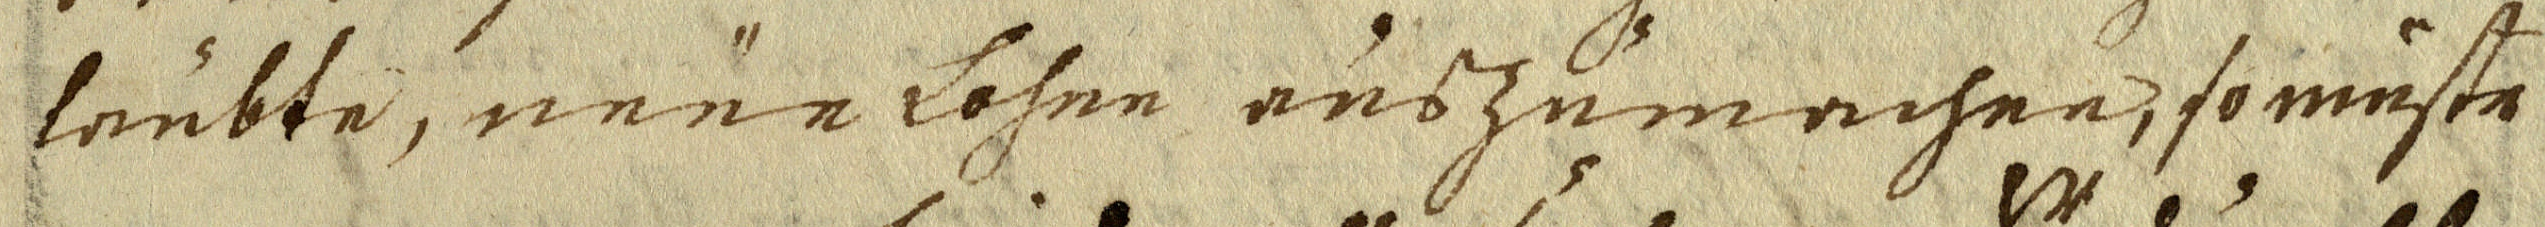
laubte, neue Lohne auszumachen, so müste
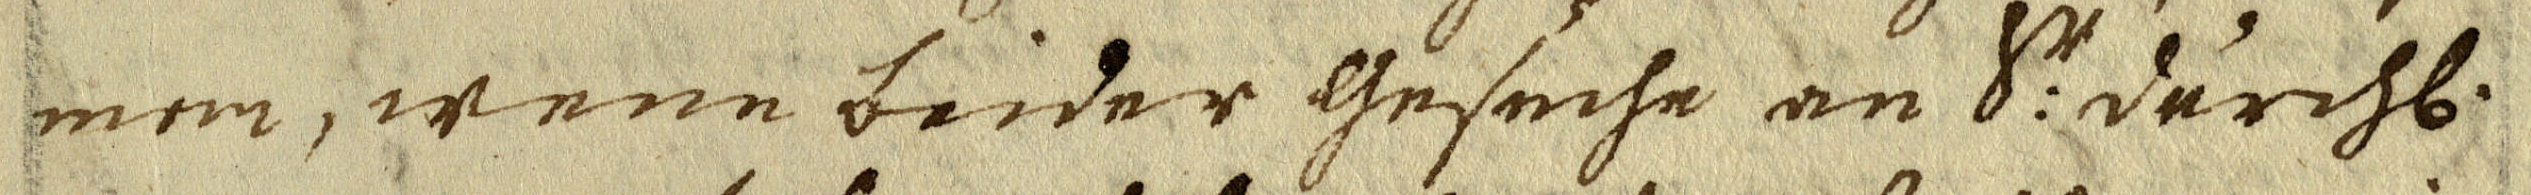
man, wenn beider Gesuche an Sr Durchl.
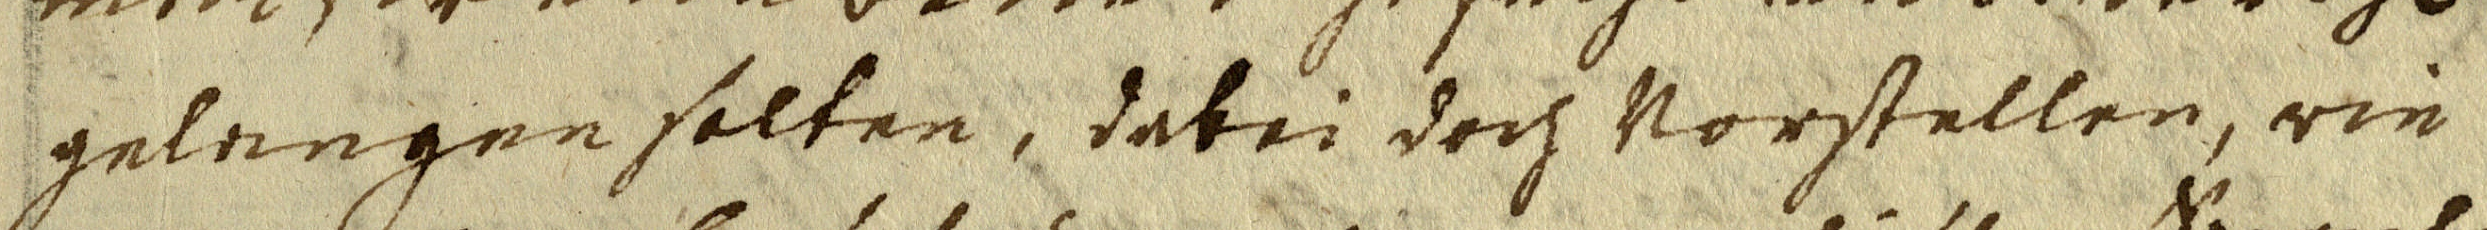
gelangen solten, dabei doch vorstellen, wie
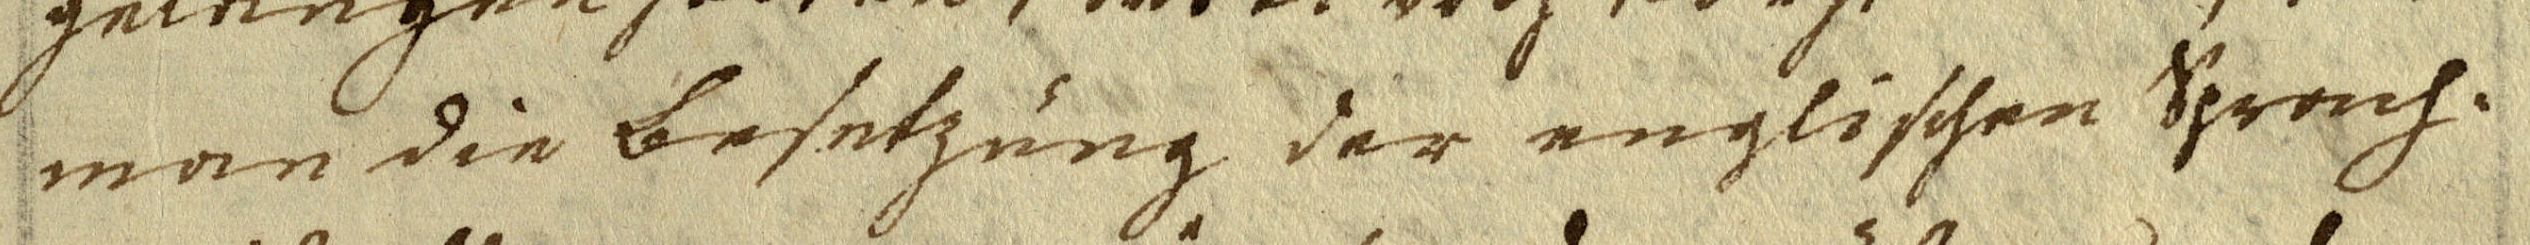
man die Besetzung der englischen Sprach¬
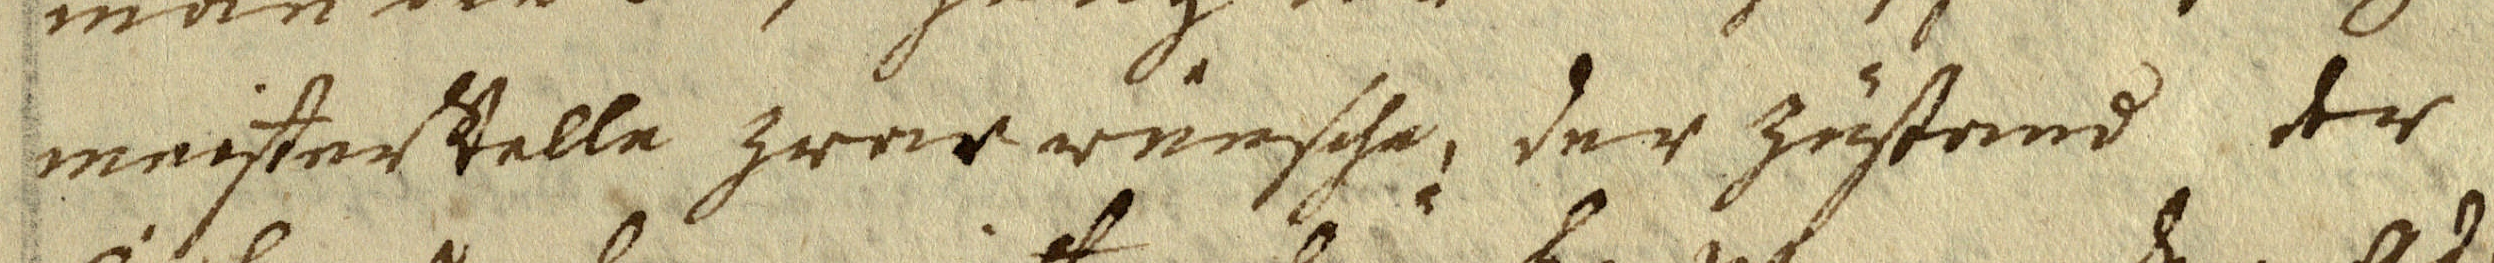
meisterstelle zwar wünsche, der Zustand der
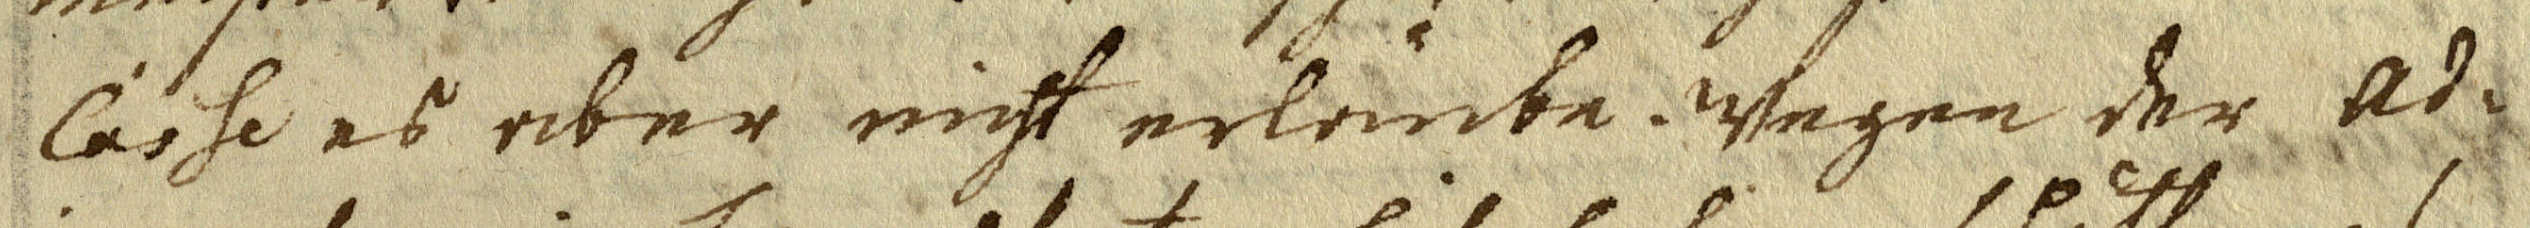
Casse es aber nicht erlaube. Wegen der Ad¬
